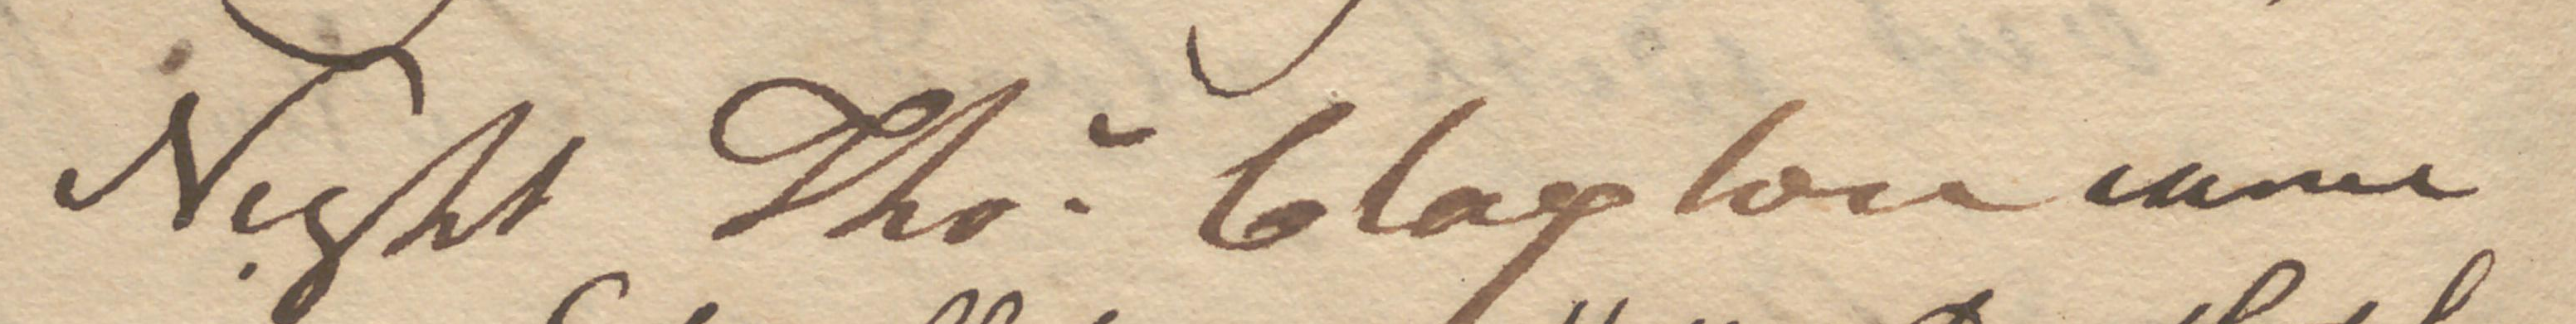Night Tho^s. Clayton came
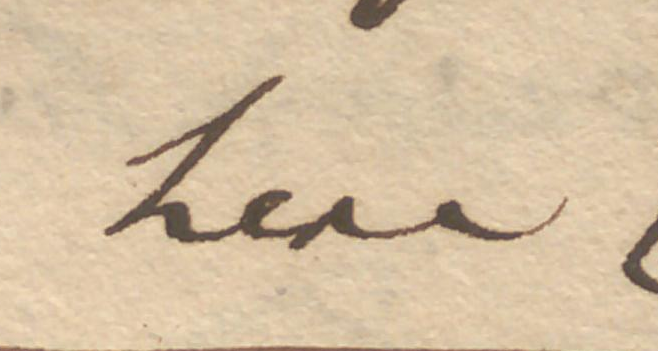here
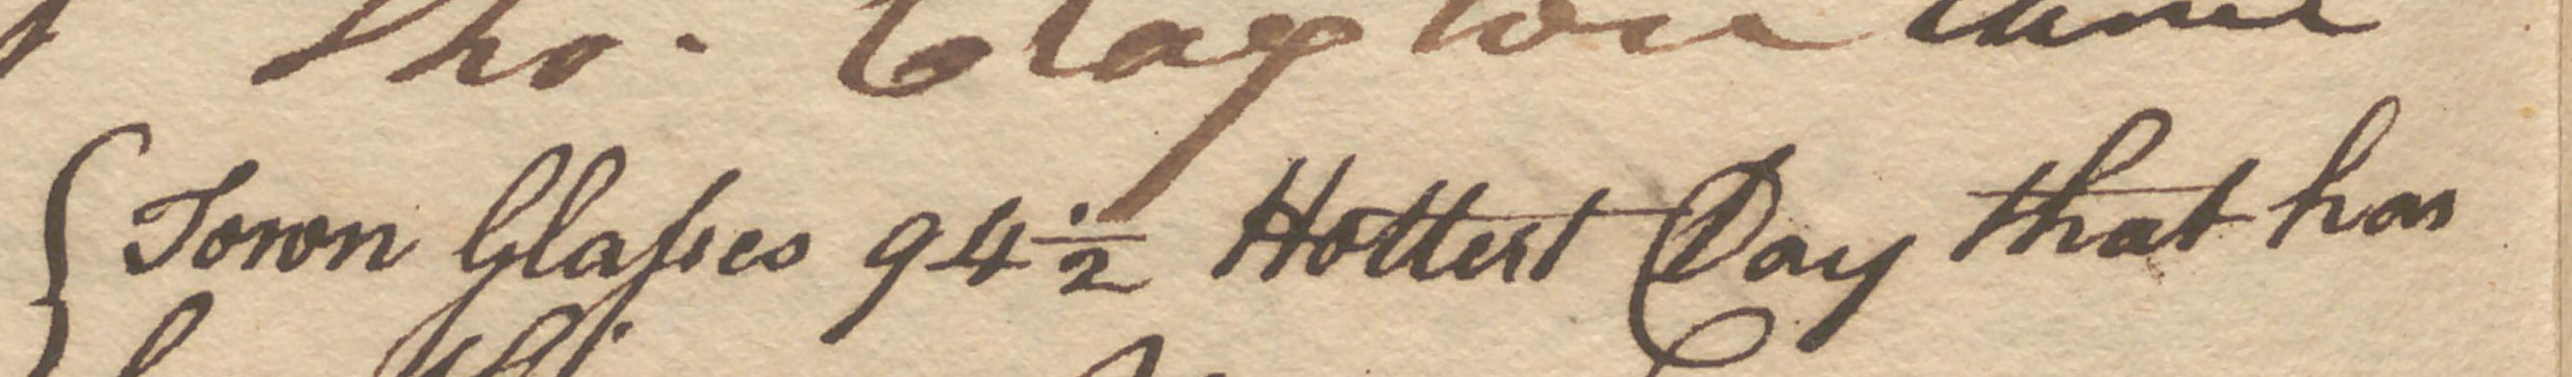Town Glasses 94 1/2 Hottest Day that has
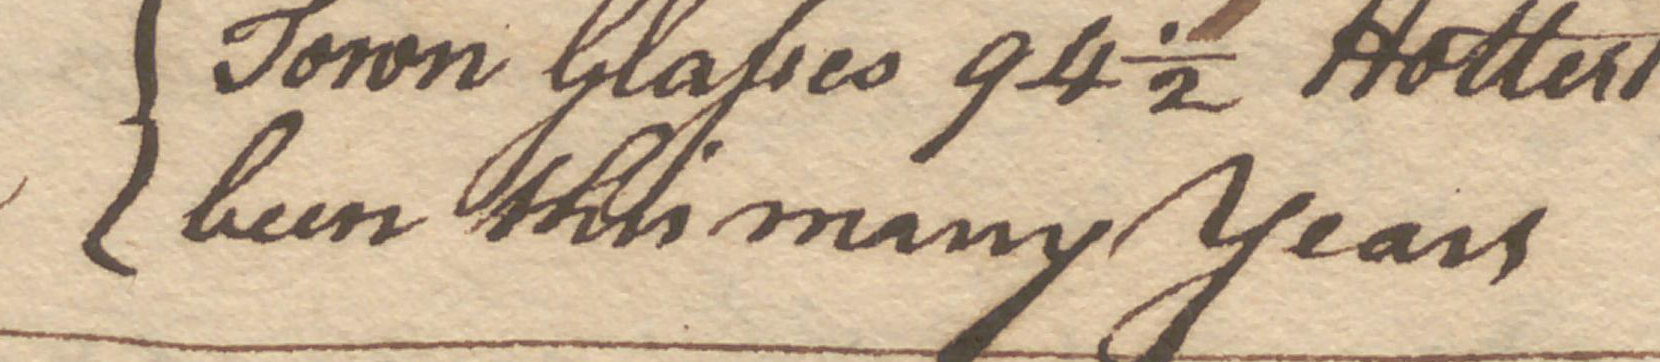been this many years
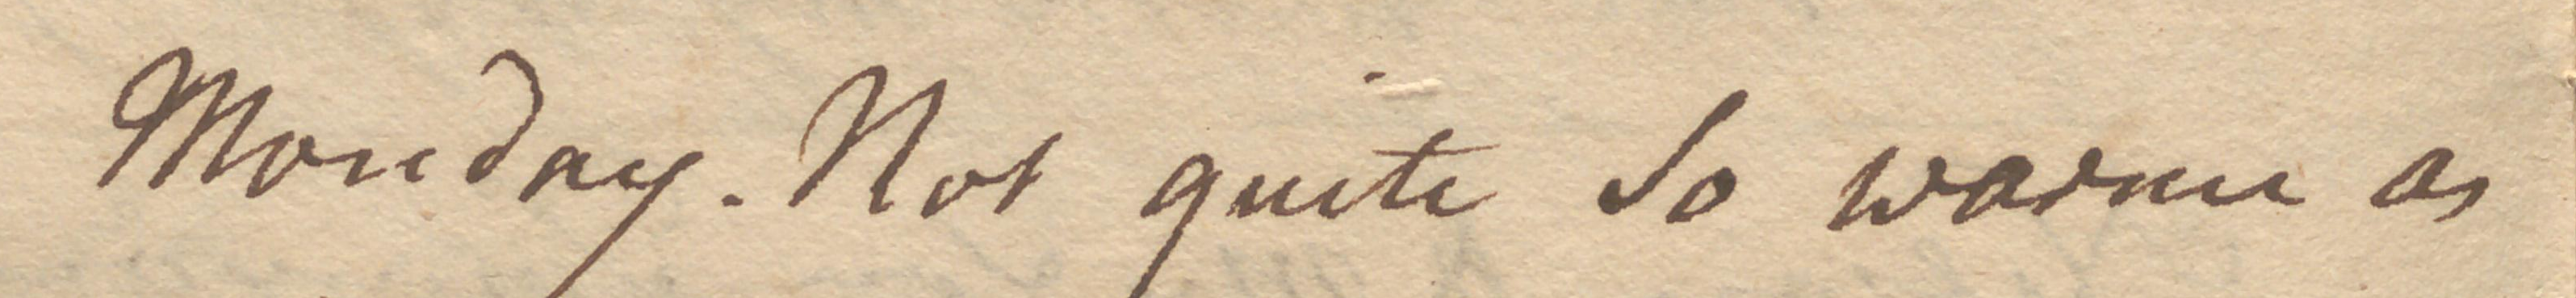Monday. Not quite so warme as
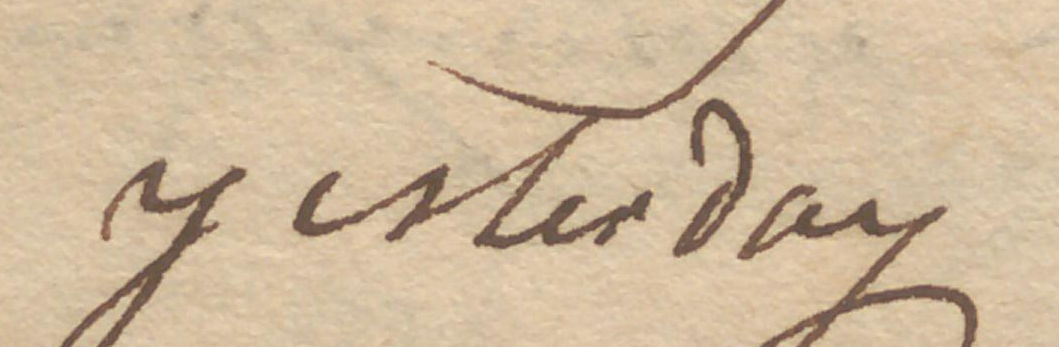yesterday
